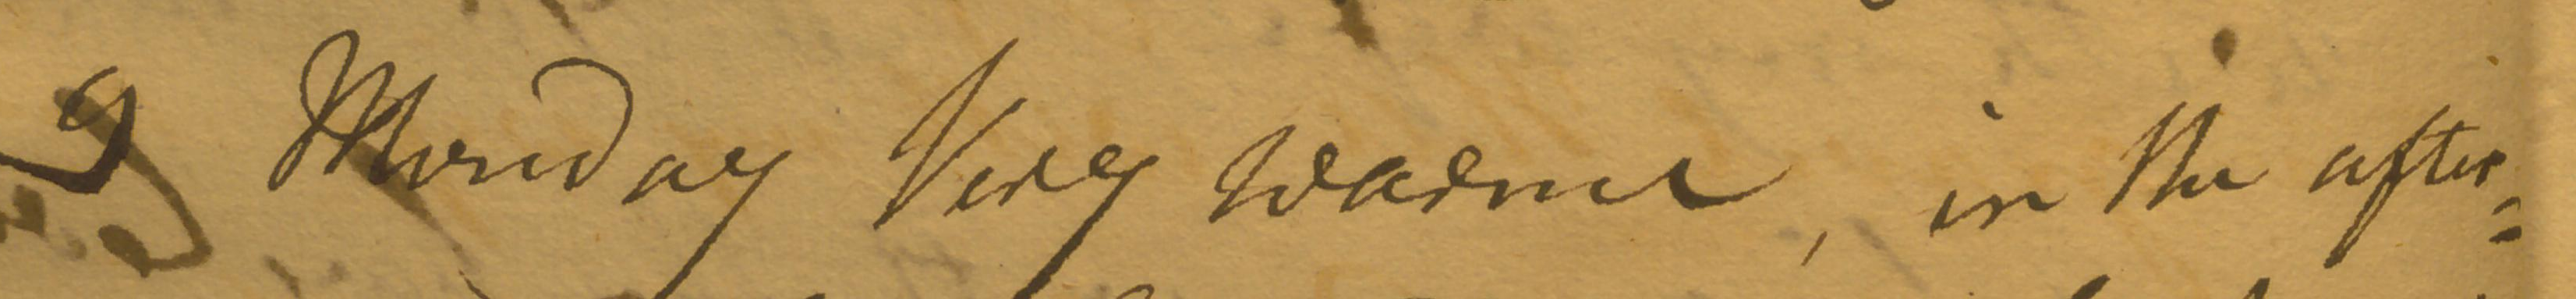9 Monday Very warme, in the after-
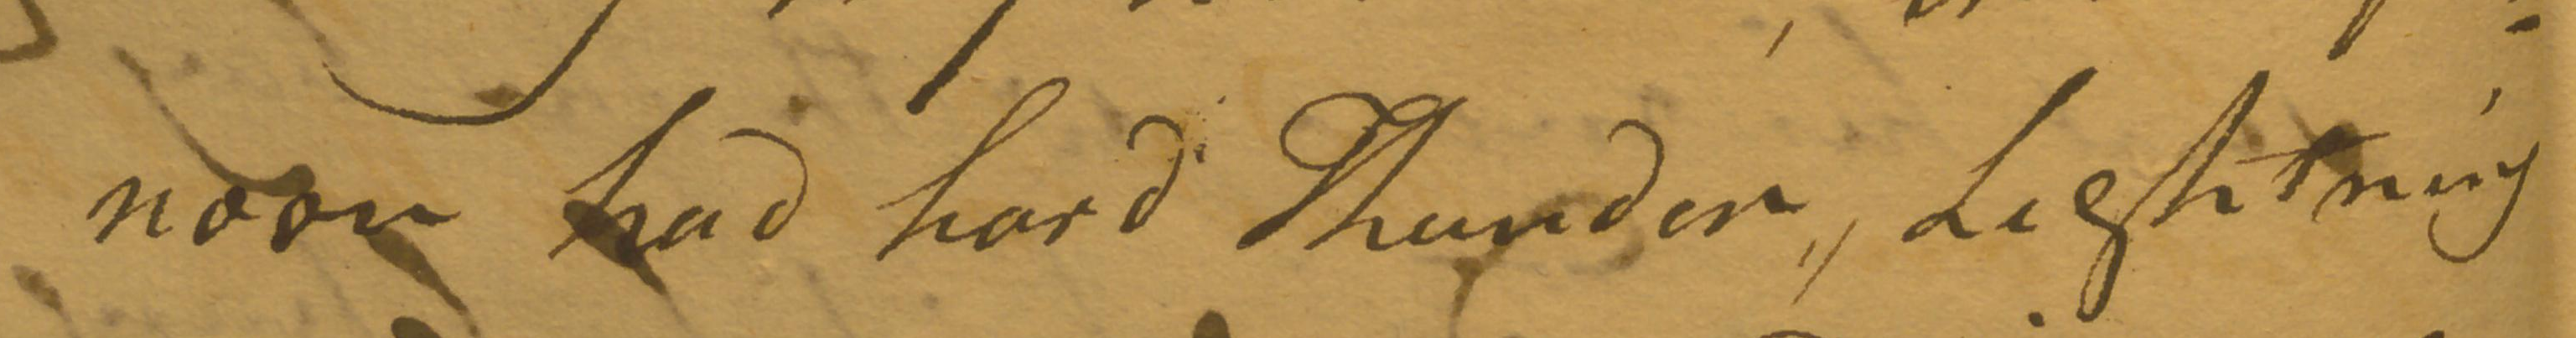noon had hard Thunder, Lightning
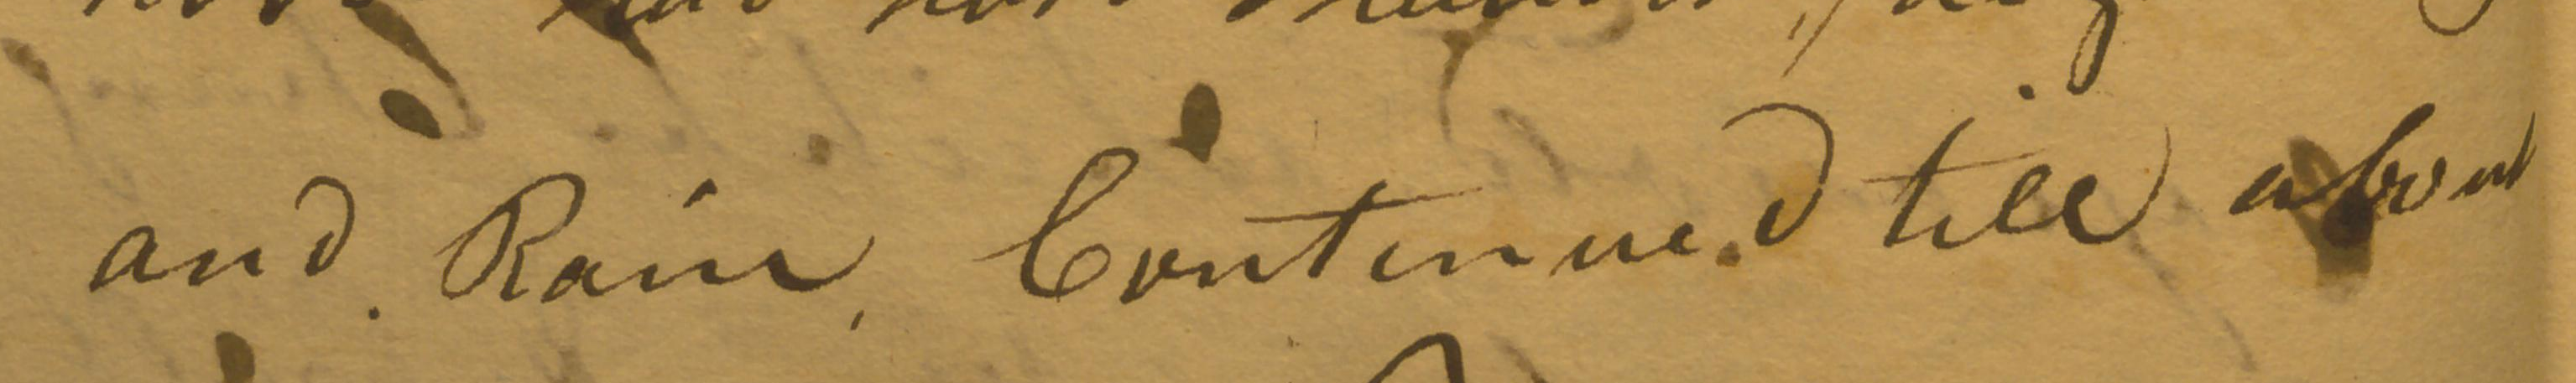and Raine Continued till about
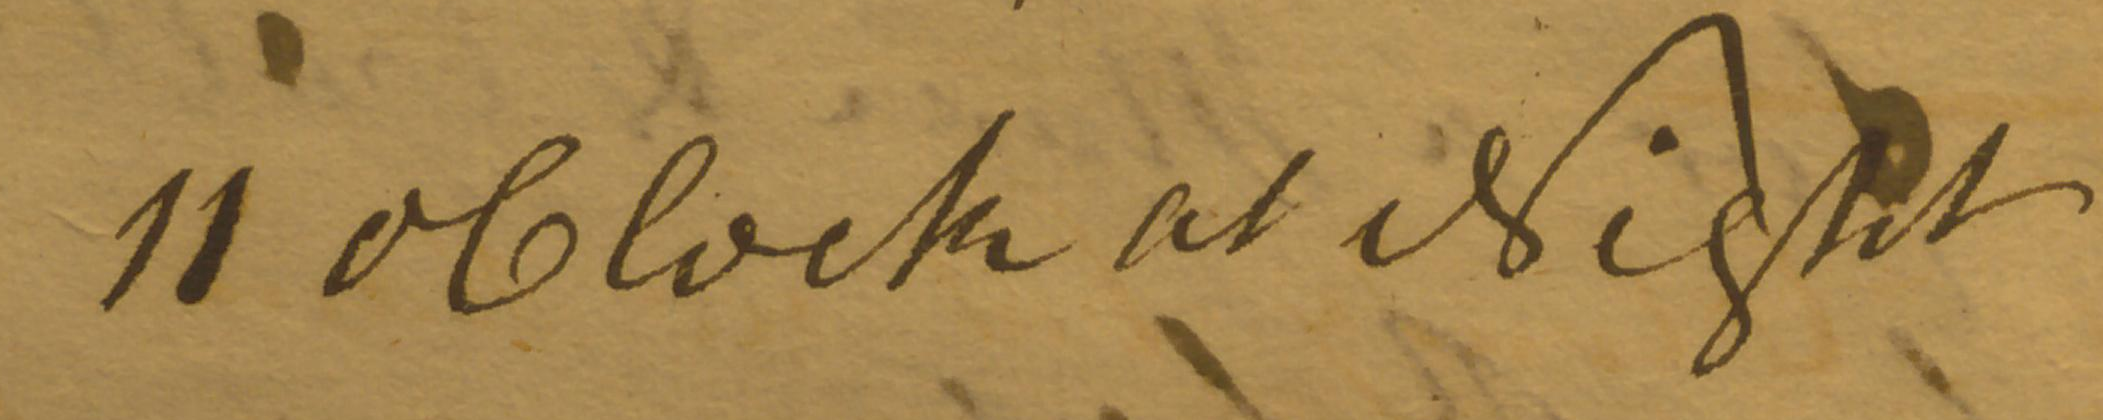11 oClock at Night
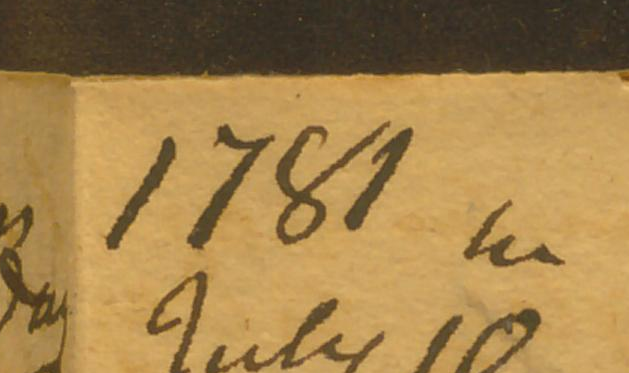1781
